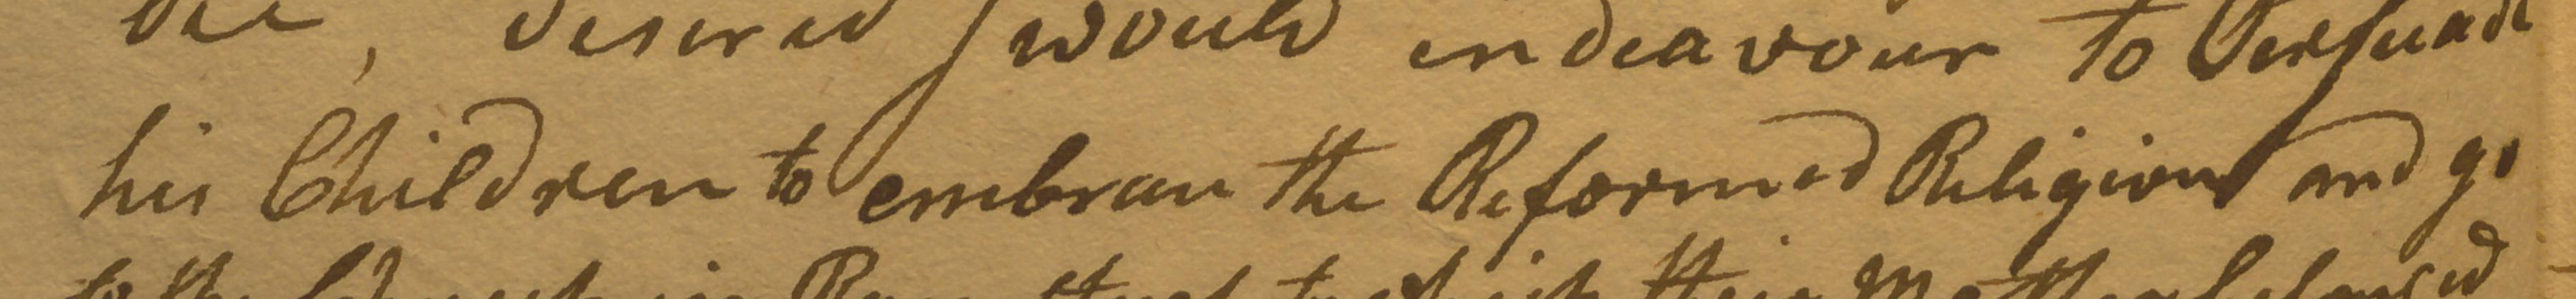his Children to embrace the Reformed Religion and go
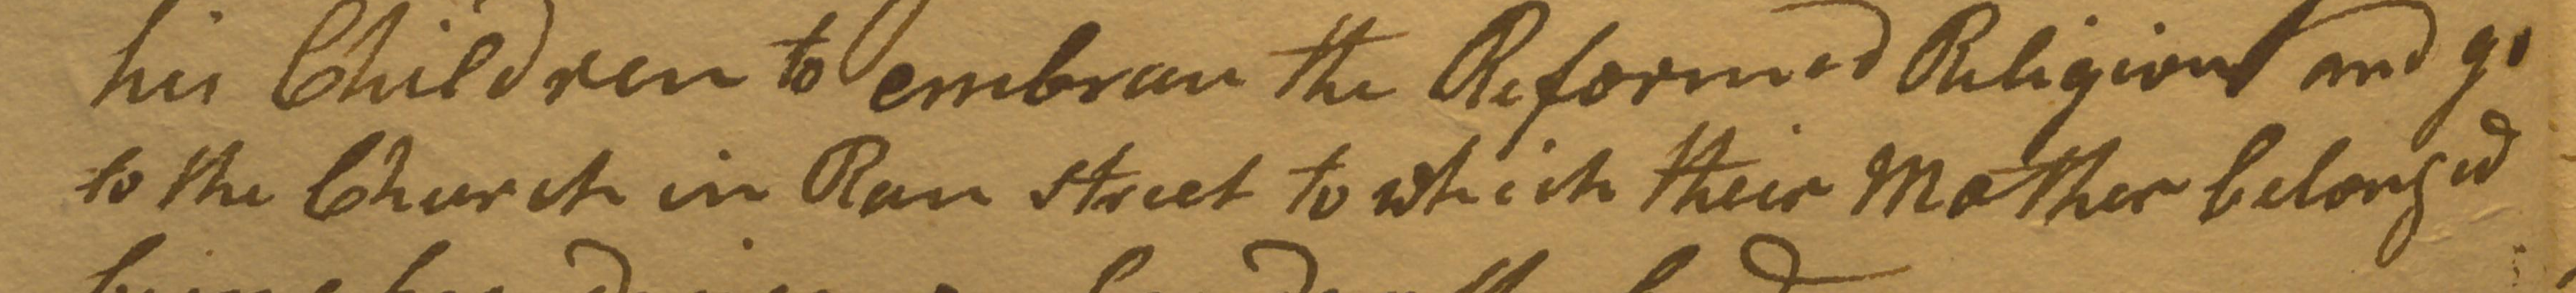to the Church in Race street to which their Mother belonged
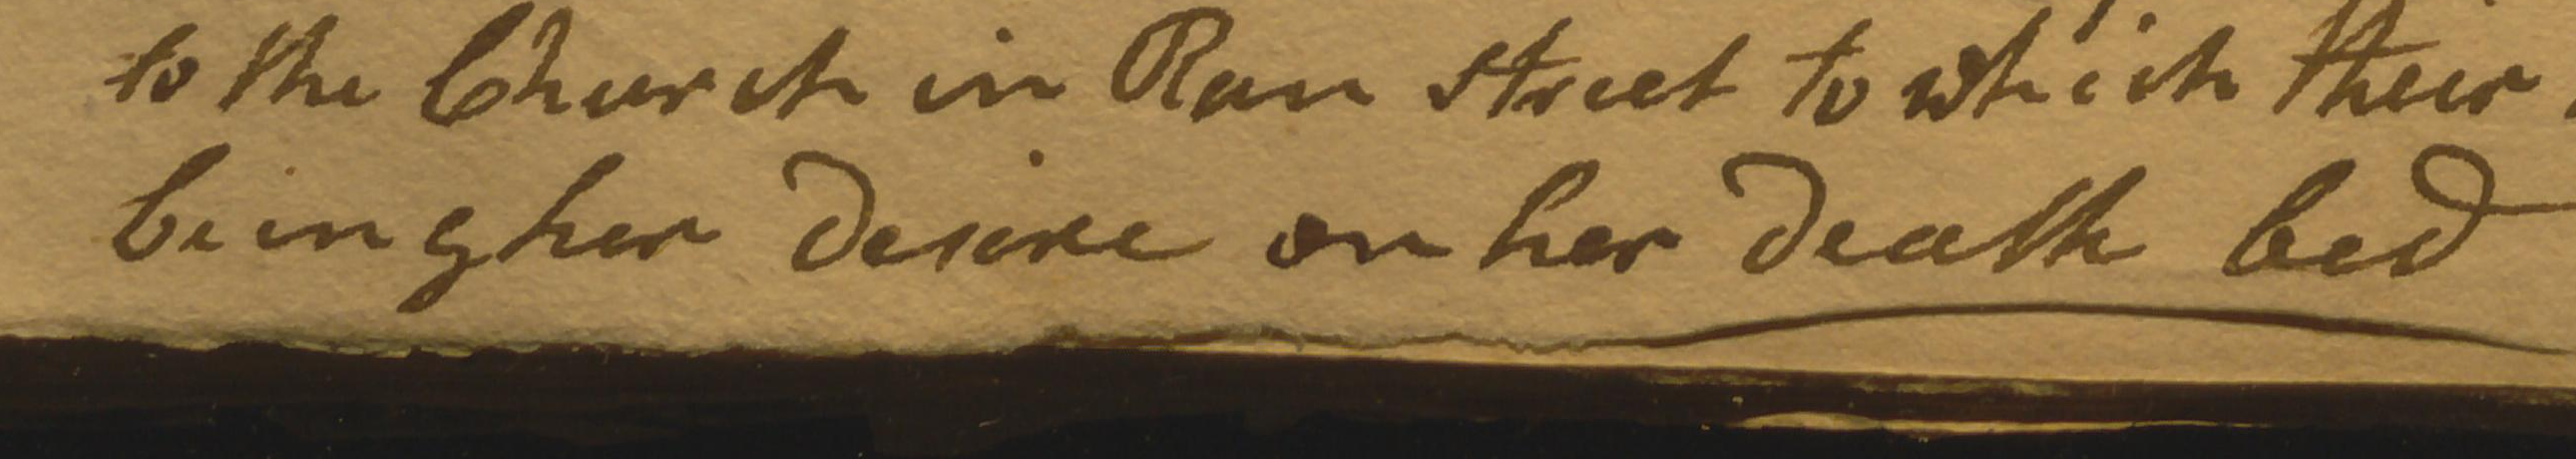being her desire on her death bed
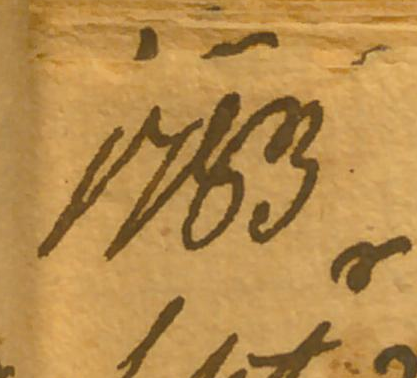1783
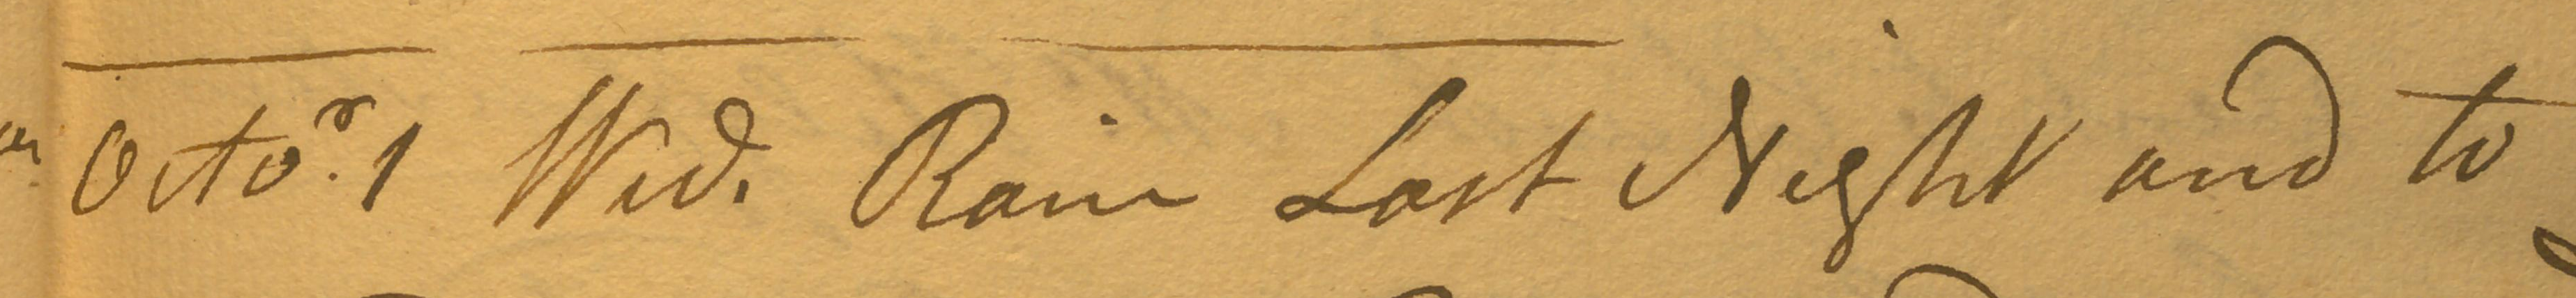Octo^r. 1 Wed. Rain Last Night and to
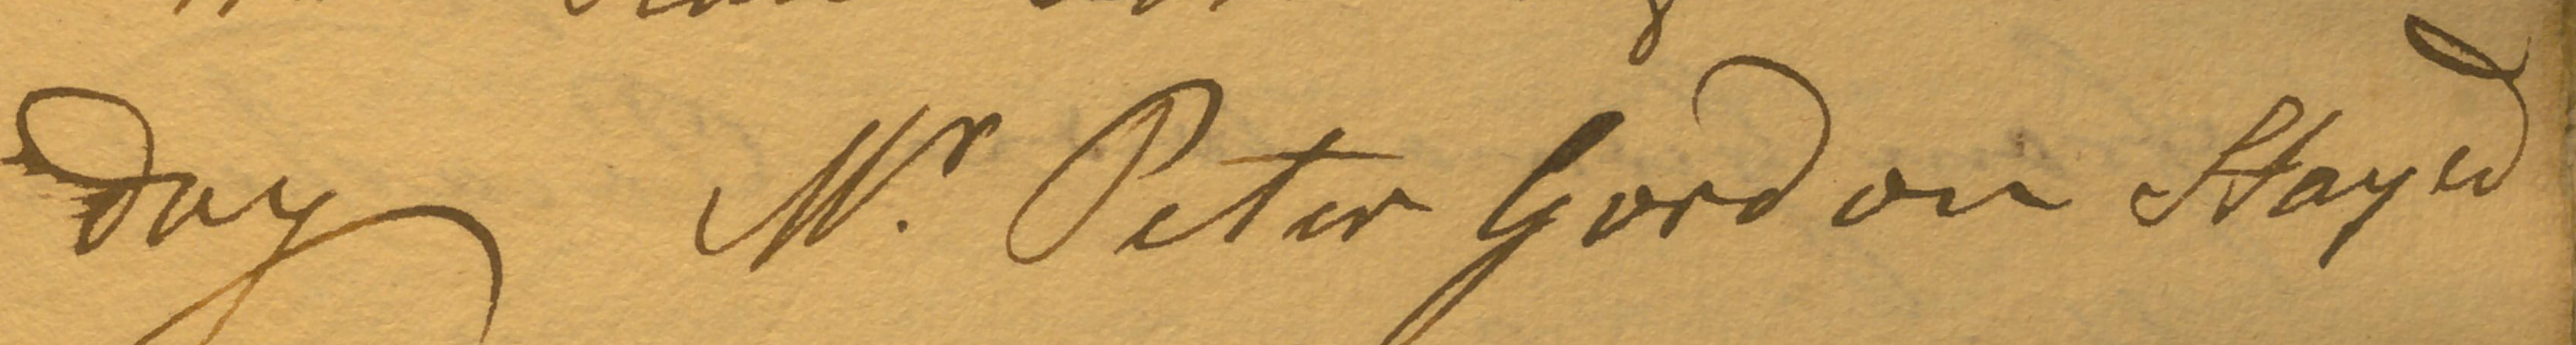day M^r. Peter Gordon Stayed
